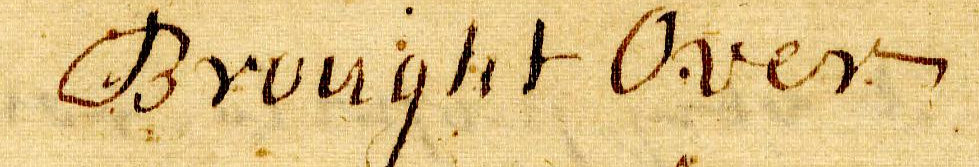Brought Over
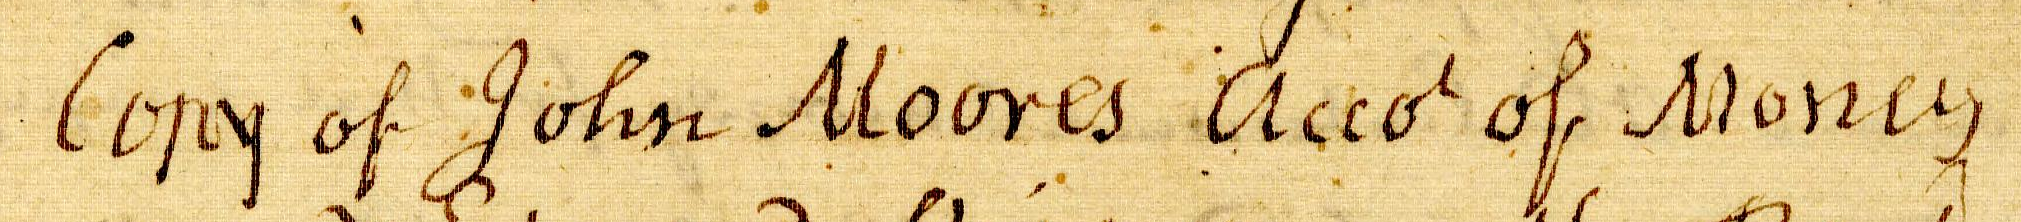Copy of John Moores Acco^t of Money
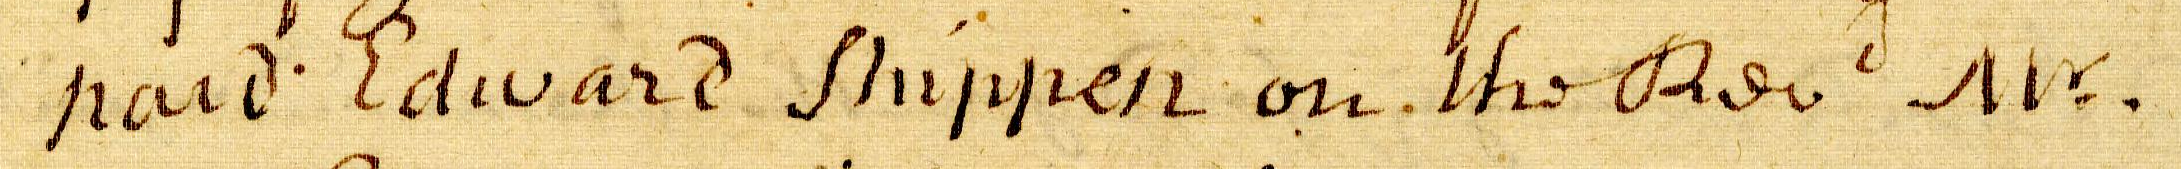paid Edward Shippen on the Rev^d M^r.
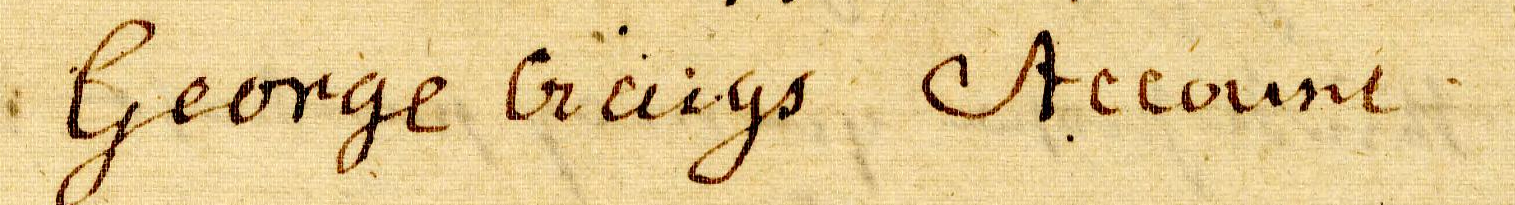George Craigs Account
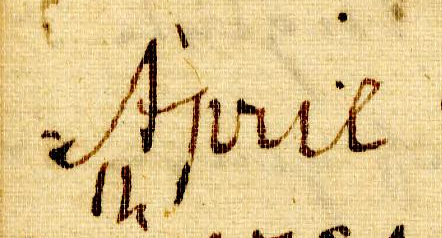April
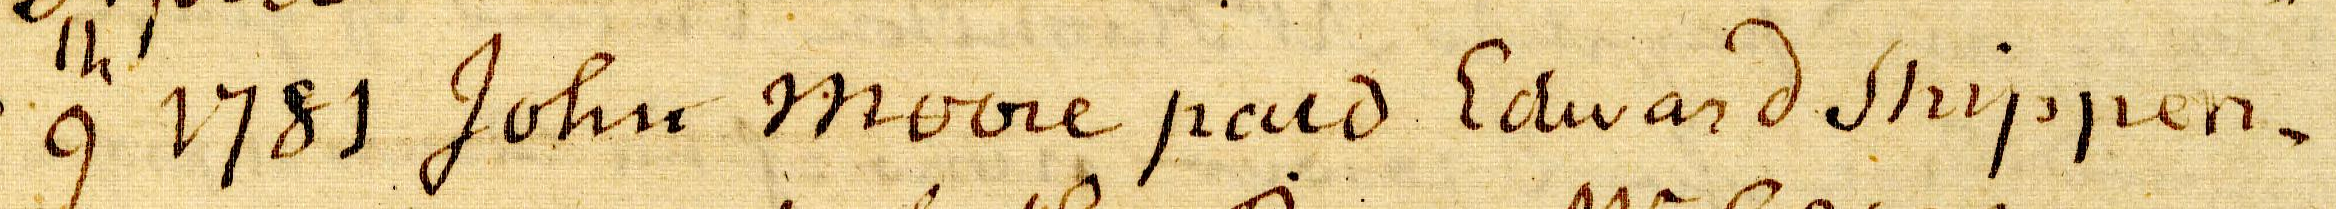9^th 1781 John Moore paid Edward Shippen.
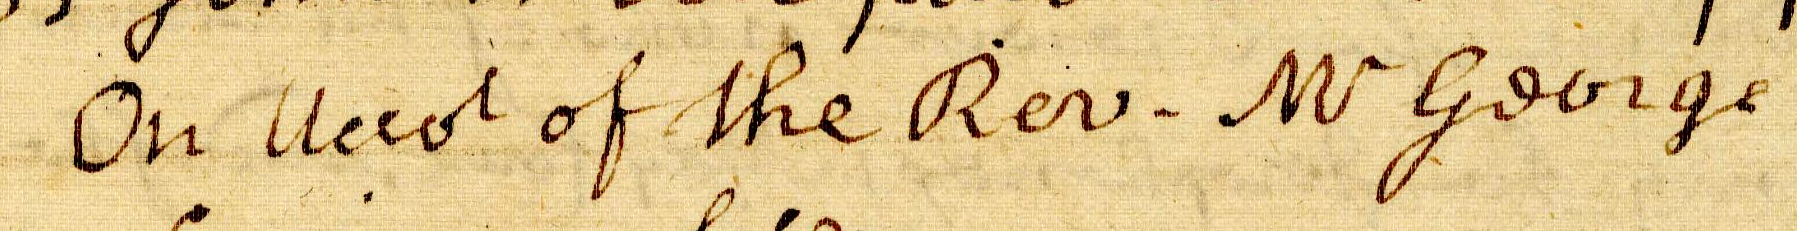On Acco^t of the Rev- M^r George
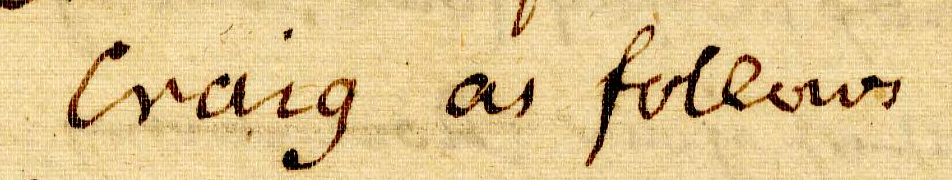Craig as follows
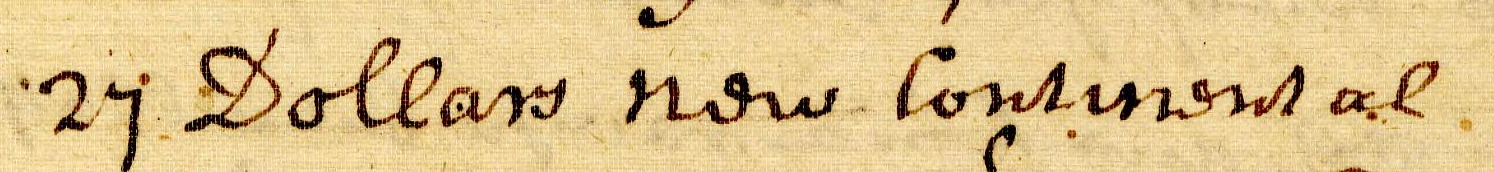27 Dollars now Continental
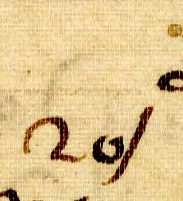20s
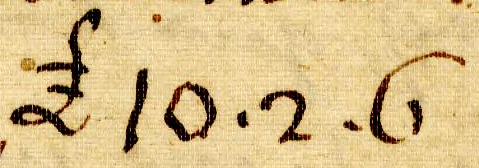£10.2.6
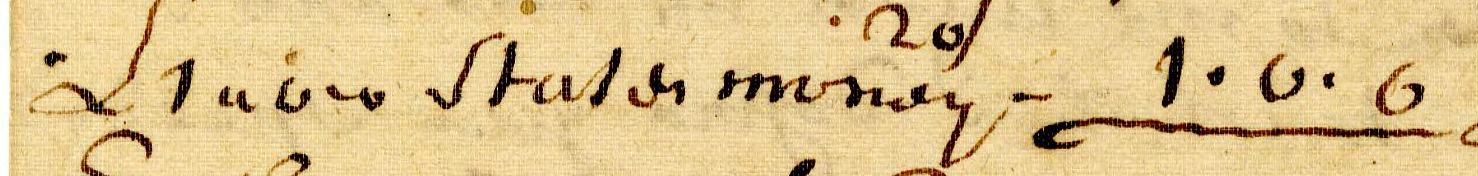£1..6.6 States money- 1.0.6
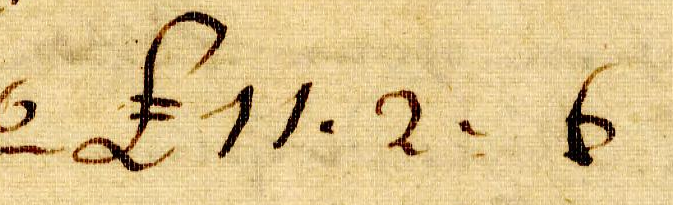£11.2.6
